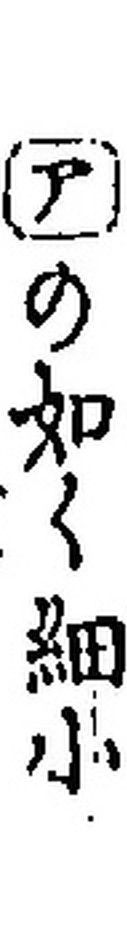アの如く細小
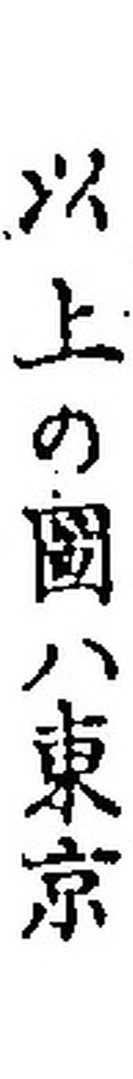以上の圖は東京
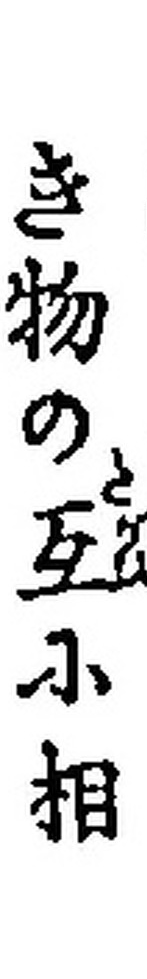き者の互に相
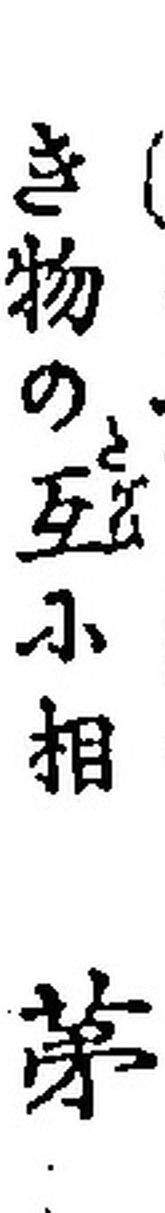き者の互に相
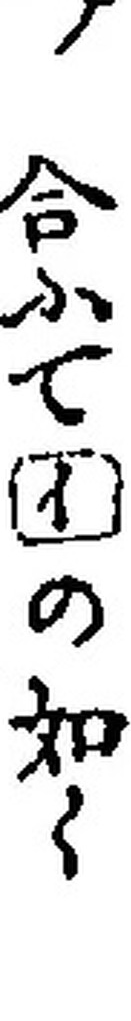合ふてイの如く
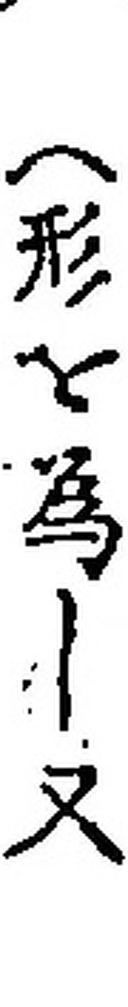へ形を為し又
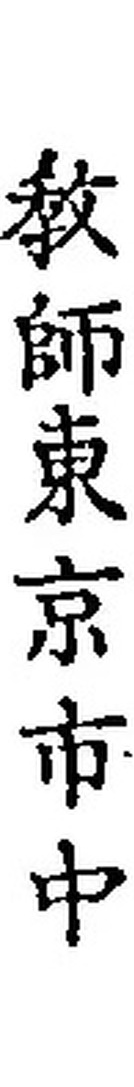教師東京市中
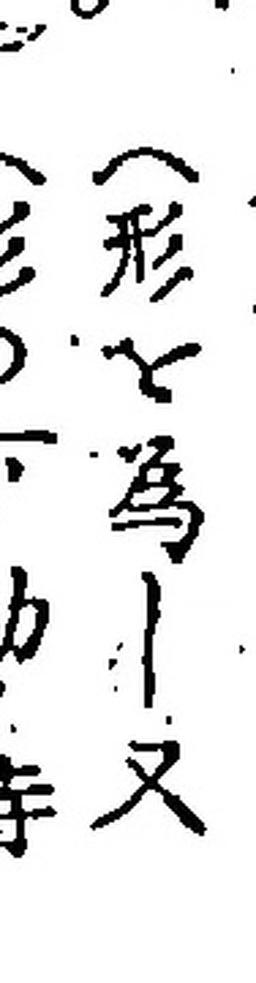へ形の下動く時
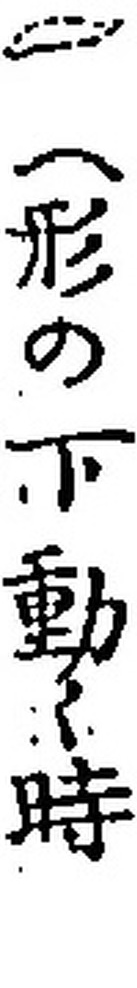へ形の下動く時
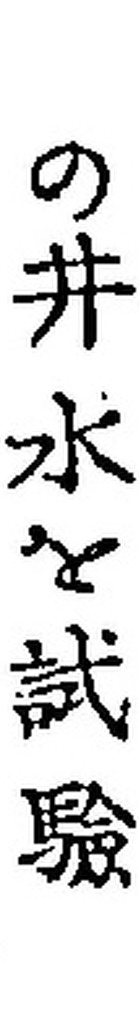の井水を試礆驗
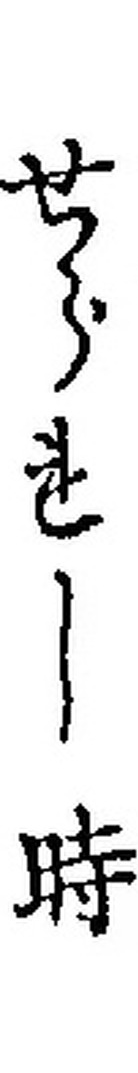せられし時
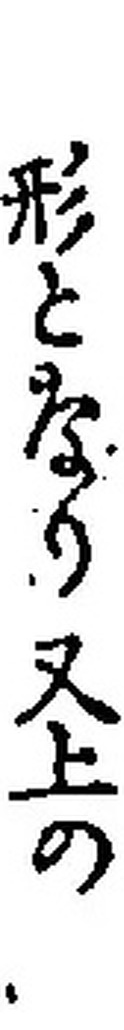形になり又上の
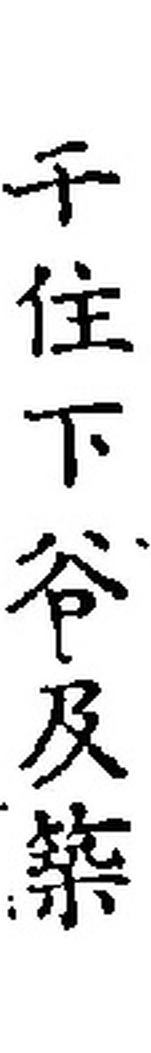千住下谷及築
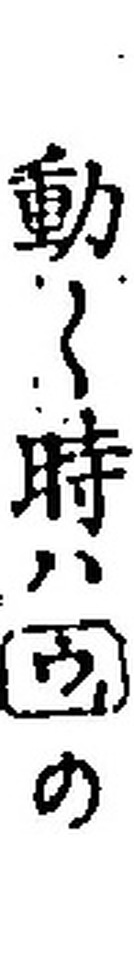動く時はウの
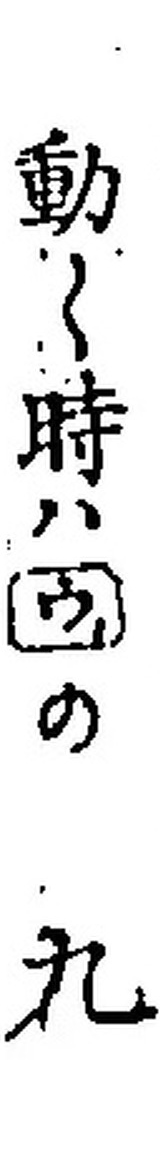動く時はウの
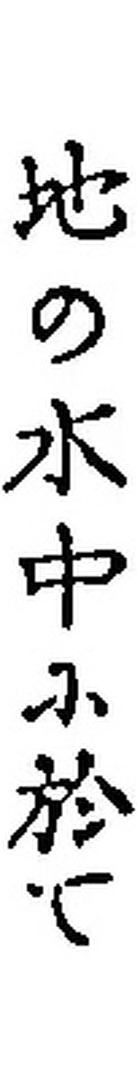地の水中に於て
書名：飲水の心得 : 伝染病の予防
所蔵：国立国会図書館 National Diet Library, JAPAN
